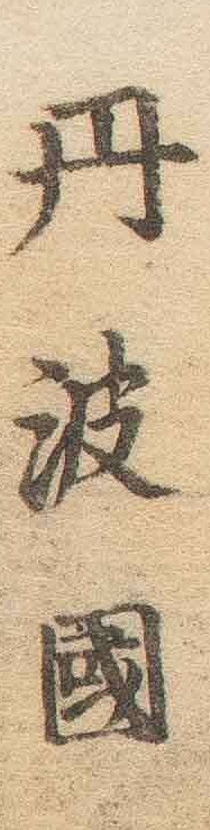丹波国
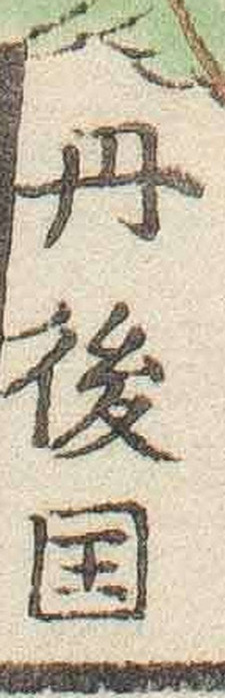丹波国

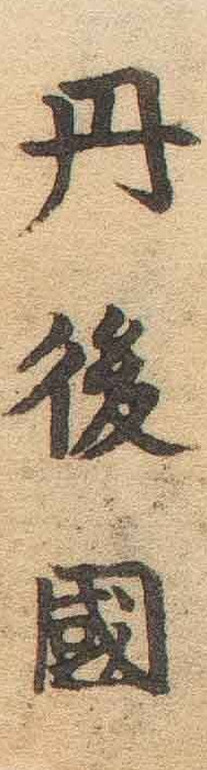丹後国

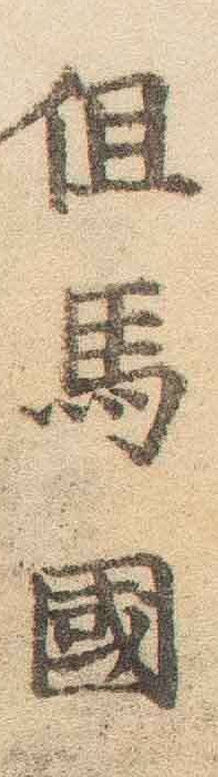但馬国

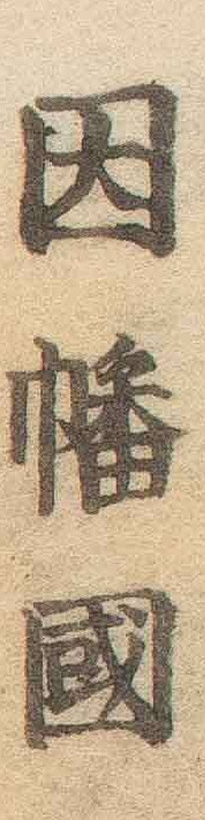因幡国
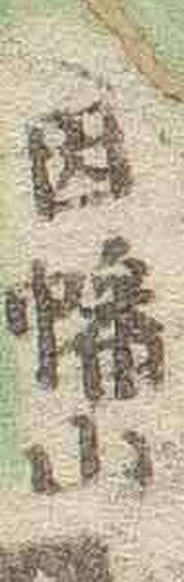因幡国

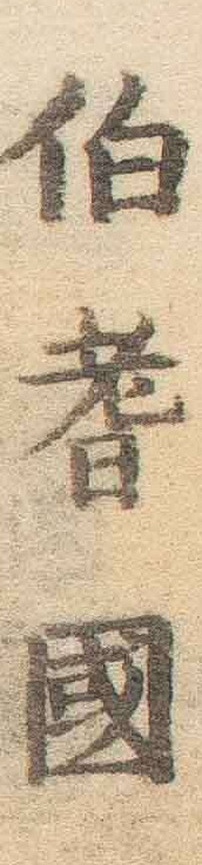伯耆国

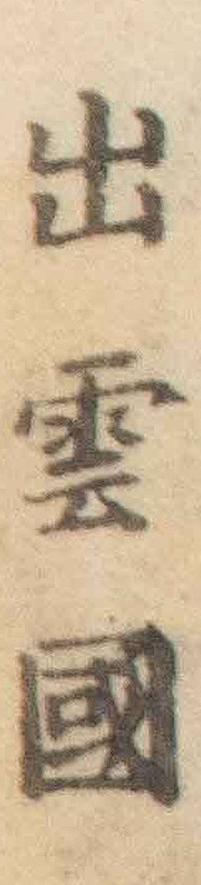出雲国

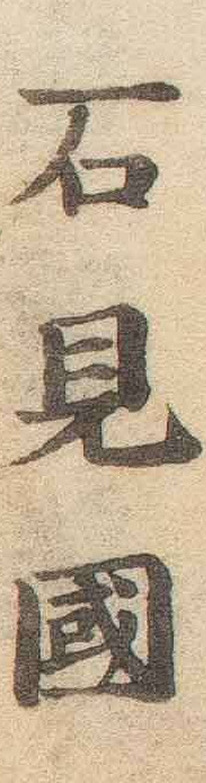石見国

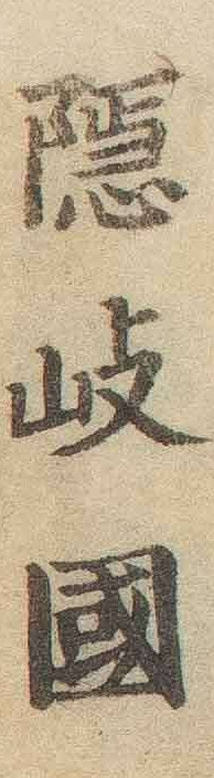隠岐国

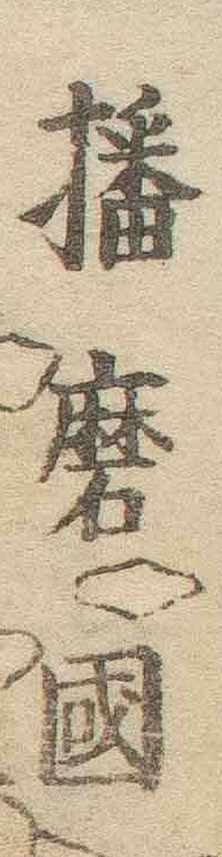播磨国

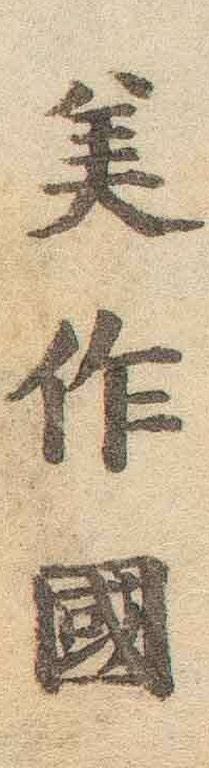美作国

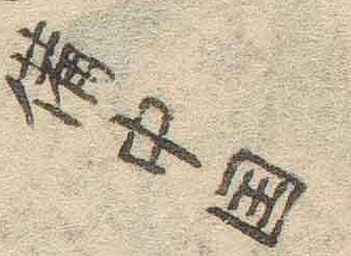備前国
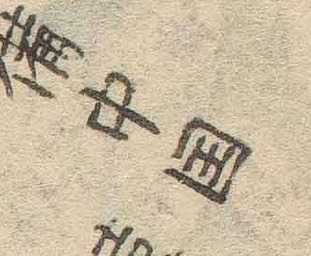備前国
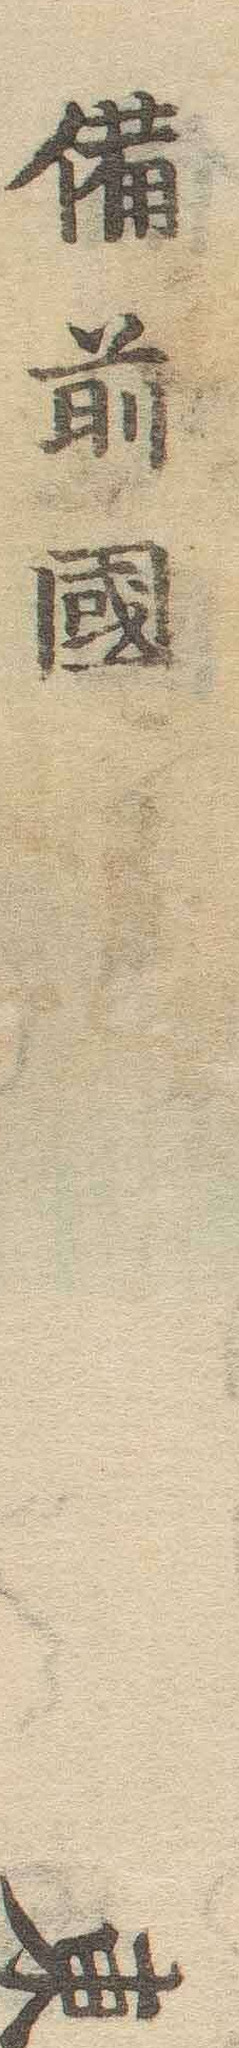備前国
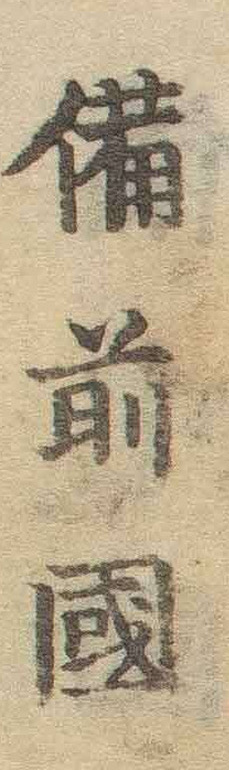備前国
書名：国郡全図
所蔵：東京学芸大学附属図書館 国文学研究資料館
